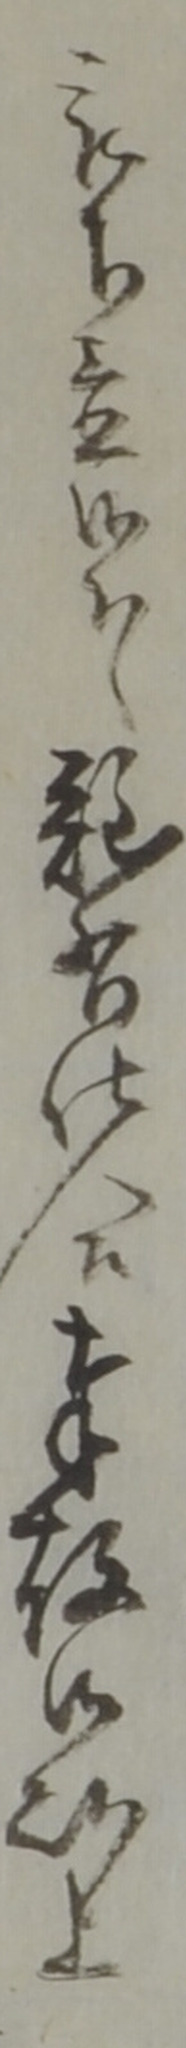被下置候ハヽ難有仕合奉存候以上
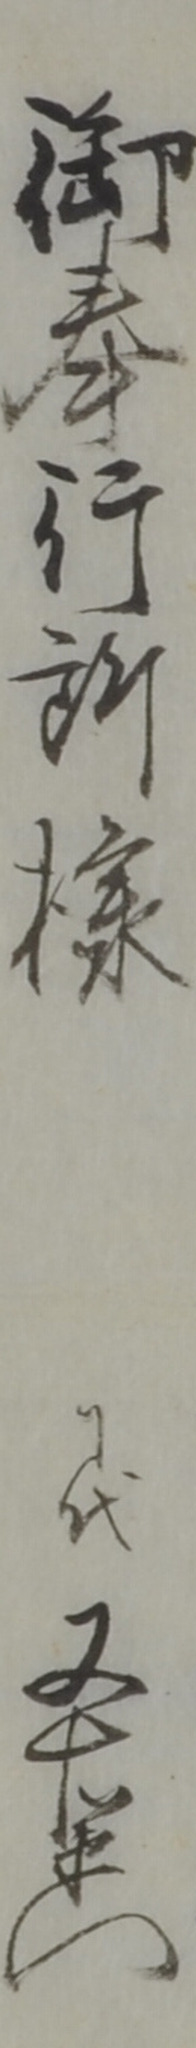御奉行所様丁代儀兵衛
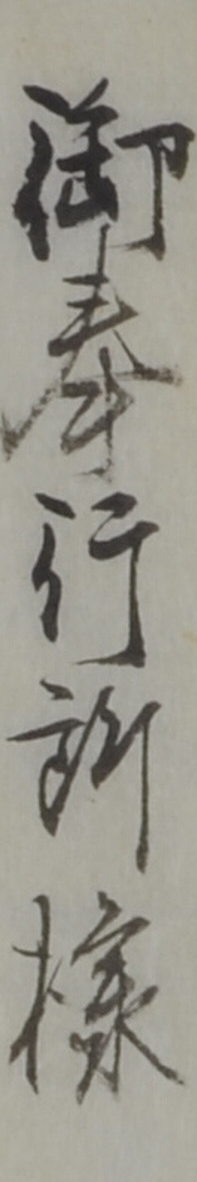御奉行所様
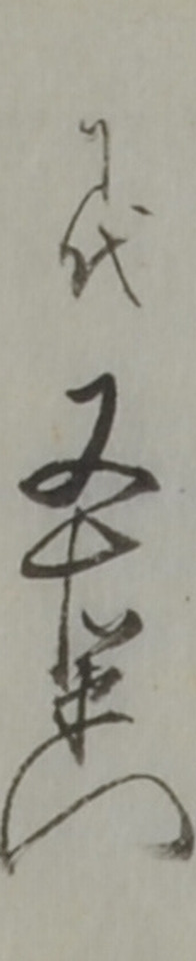丁代又右衛門
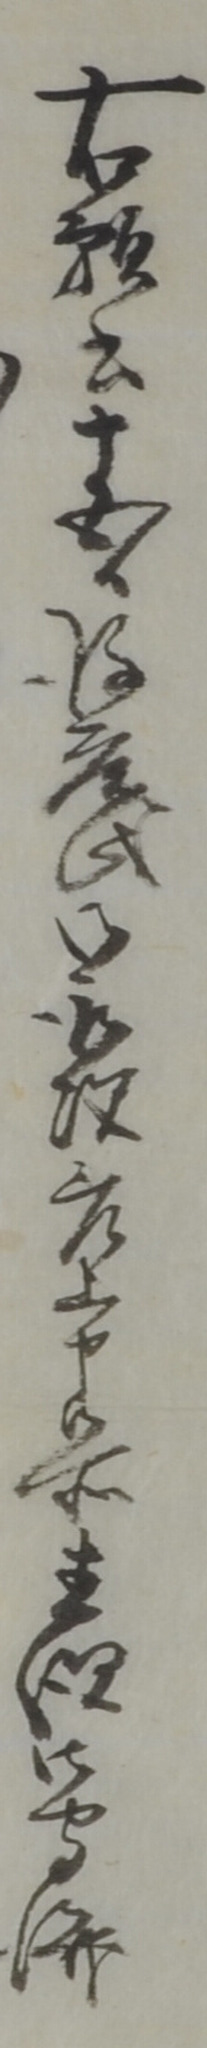右願書十五日後藤氏御取次差上申候所直様御聞済
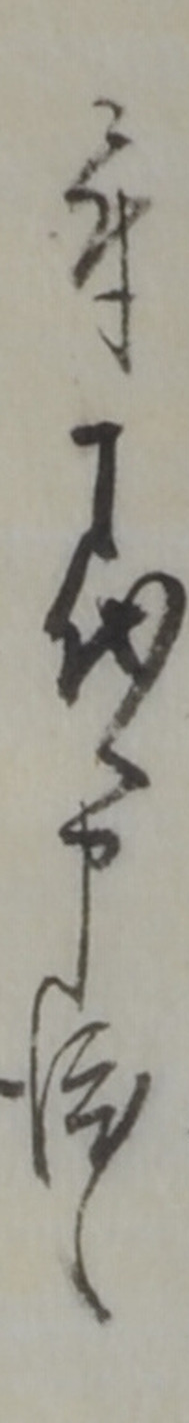ニ付丁代へ申渡候

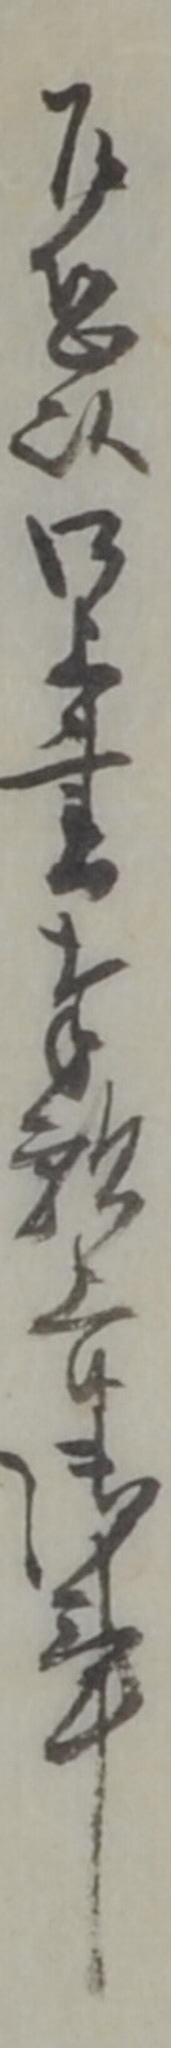乍恐以口上書奉願上候御事
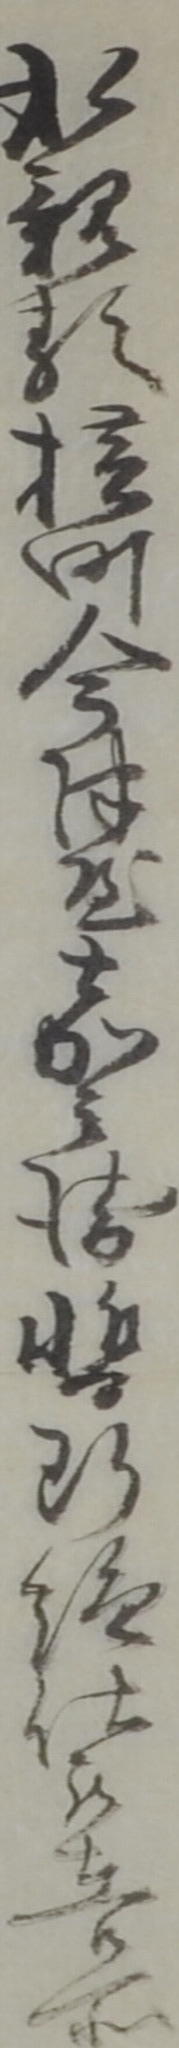私親類横町今津屋嘉兵衛暫断給仕罷在候所
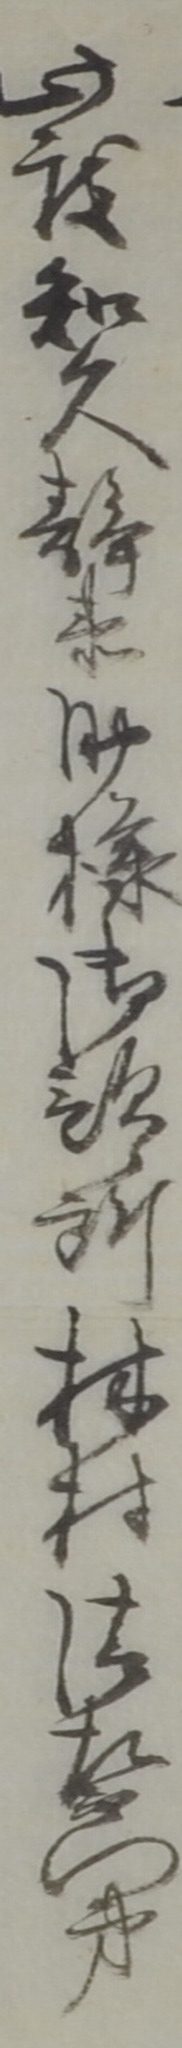此度和久静衛助様御預所林村清左衛門弟
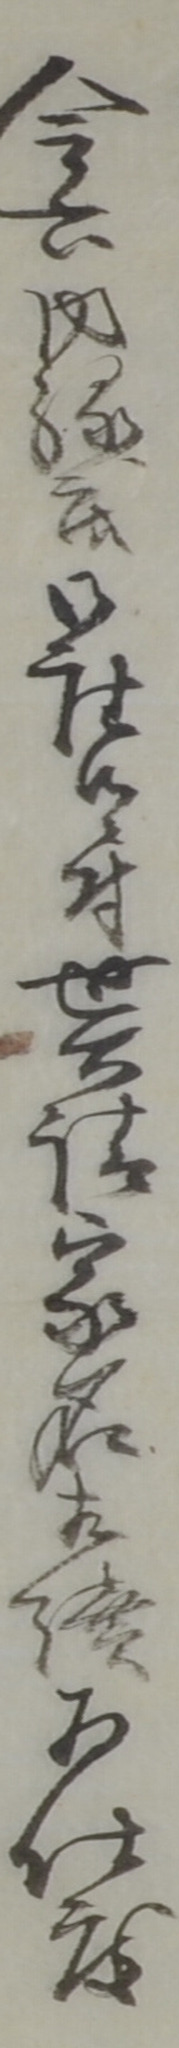今六内縁も御座候ニ付貰請家名相続為仕度
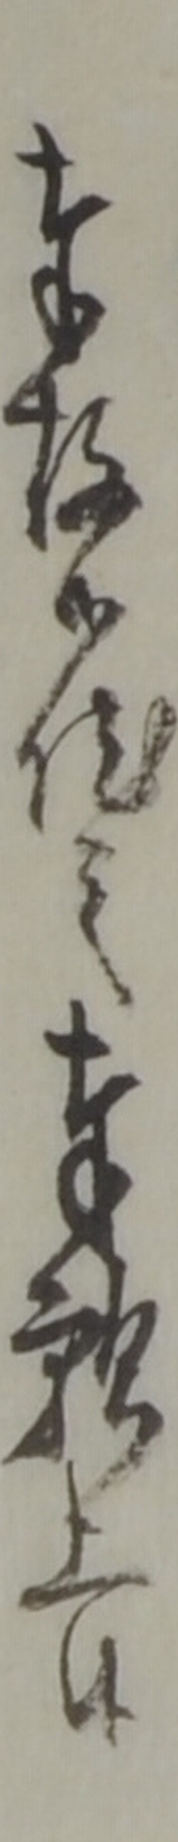奉存候依之奉願上候
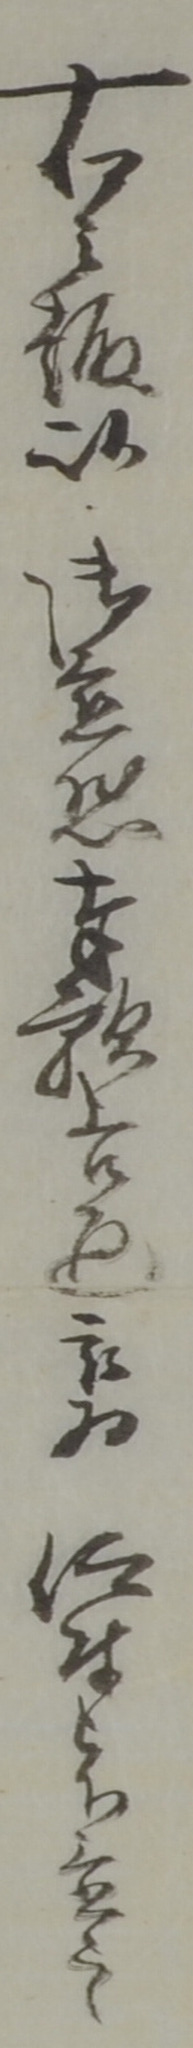右之趣以御慈悲奉願上候通被為仰付被下置候ハヽ
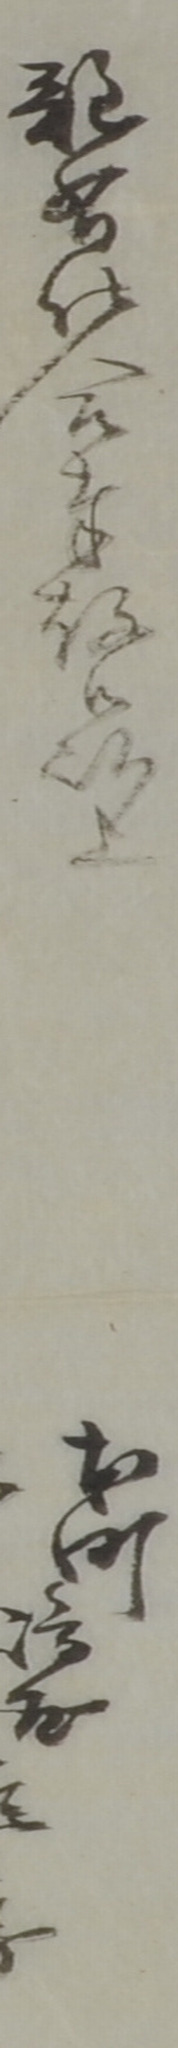難有仕合奉存候以上本町
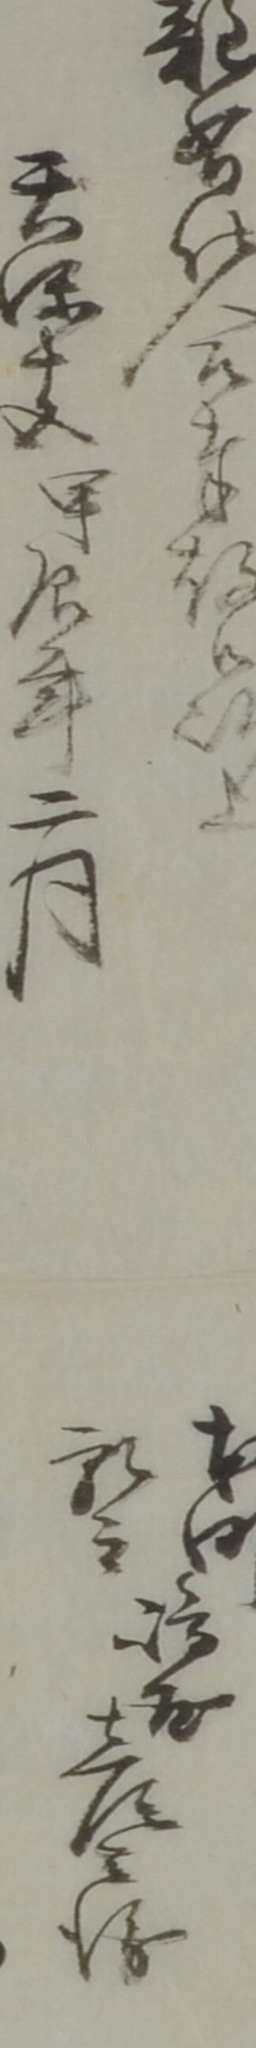天保十五甲辰年二月木綿屋
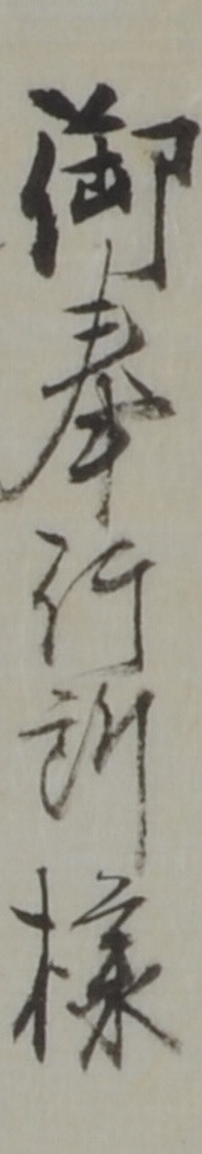御奉行所様
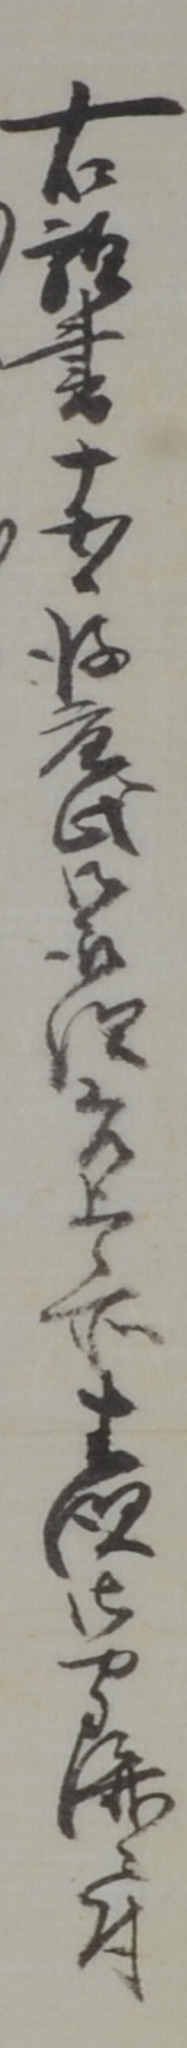右願書十五日後藤氏御取次差上候所直様御聞済ニ付
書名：諸願書控簿
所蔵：伊那市立高遠町図書館・合同会社AMANE
